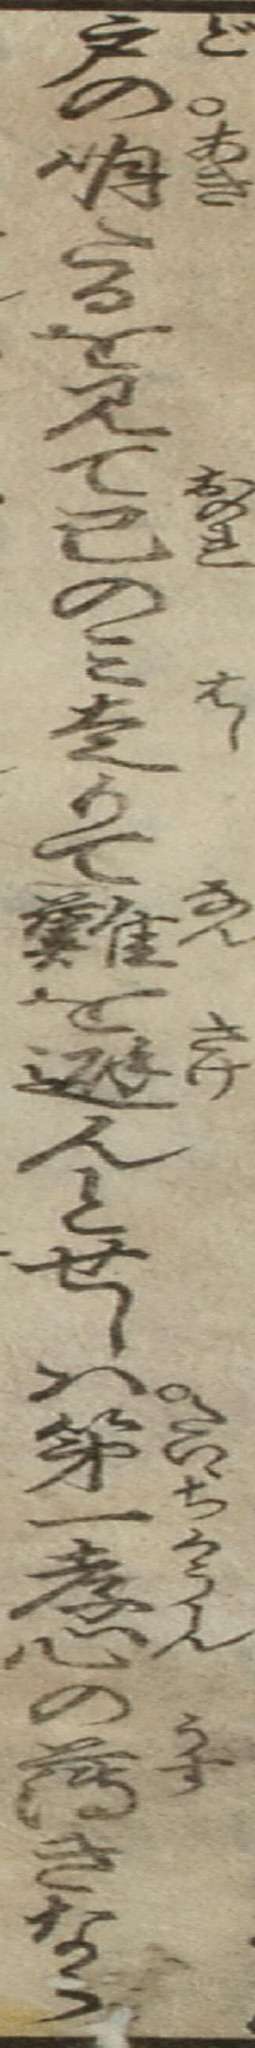戸の。明たるを見て己のみ走りて難を避んとせしは。第一孝心の薄きなら
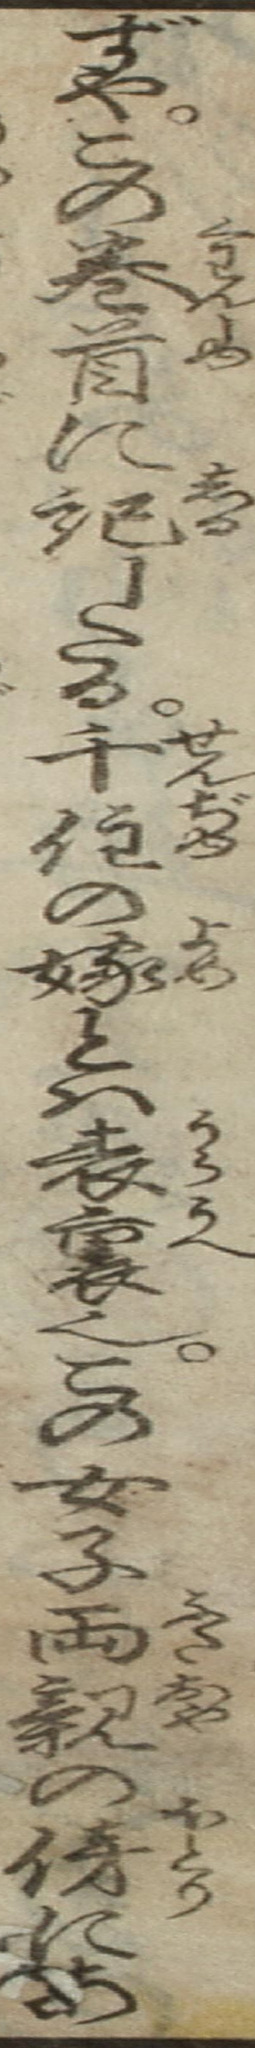ずや。この巻首に記したる。千住の嫁とは表裏なり。この女子両親の傍にあ
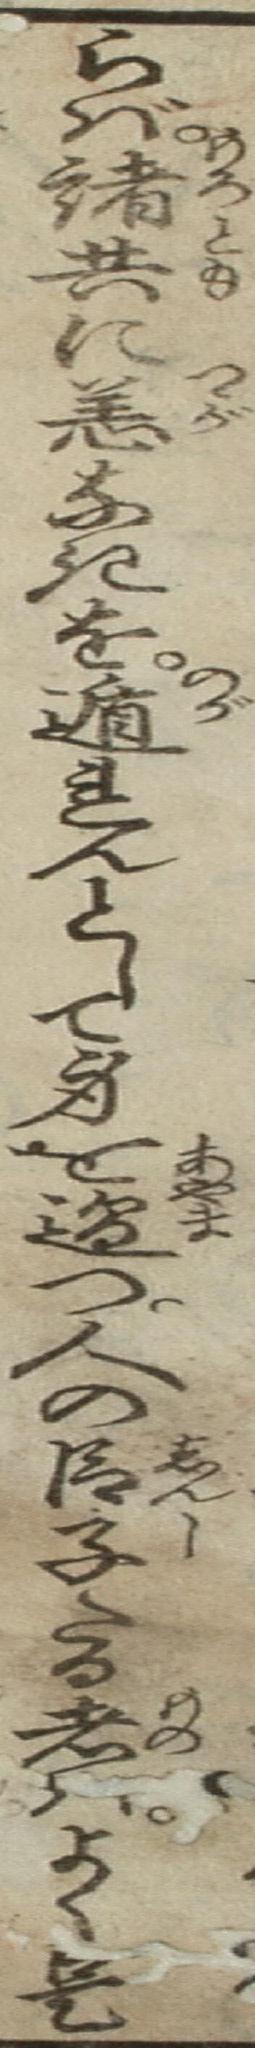らば。諸共に恙なきを。遁れんとして身を過つ人の臣子たる者は。よく是
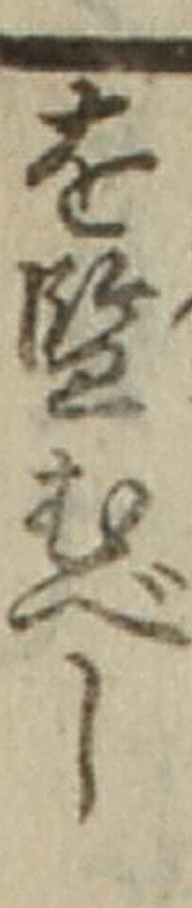を監むべし
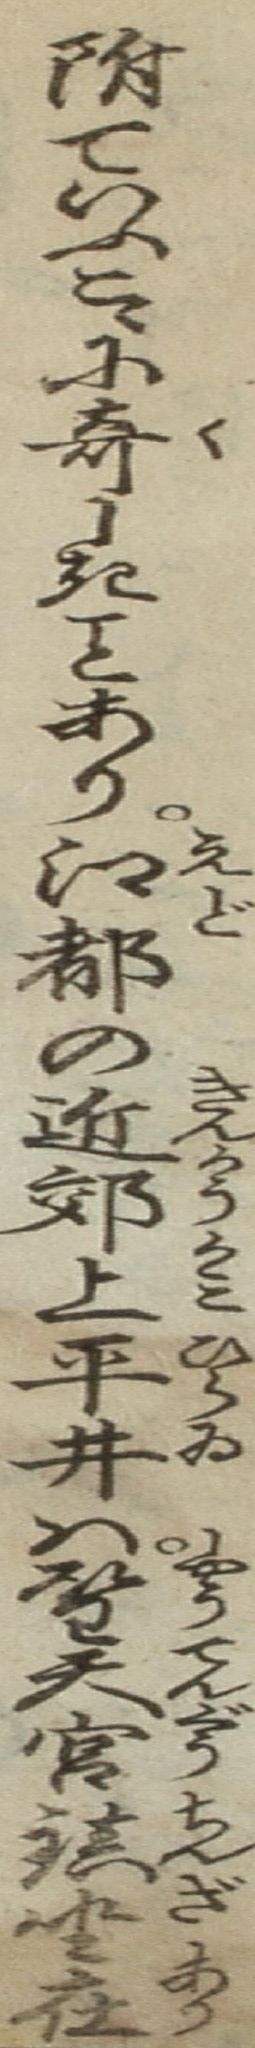附ていふこゝに奇しきことあり。江都の近郊上平井は。聖天宮鎮坐在
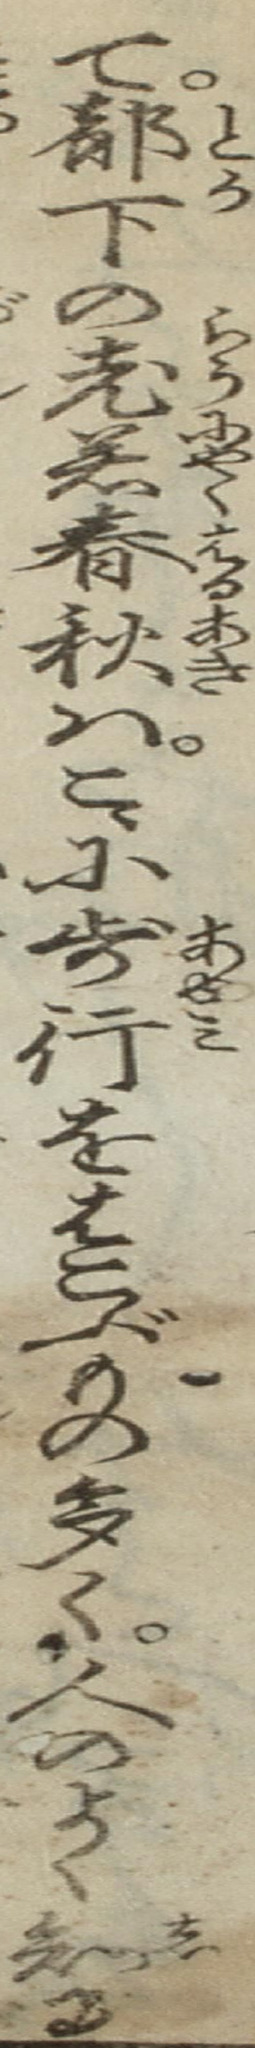て。都下の老若春秋は。こゝに歩行をはこぶもの多く。人のよく知る
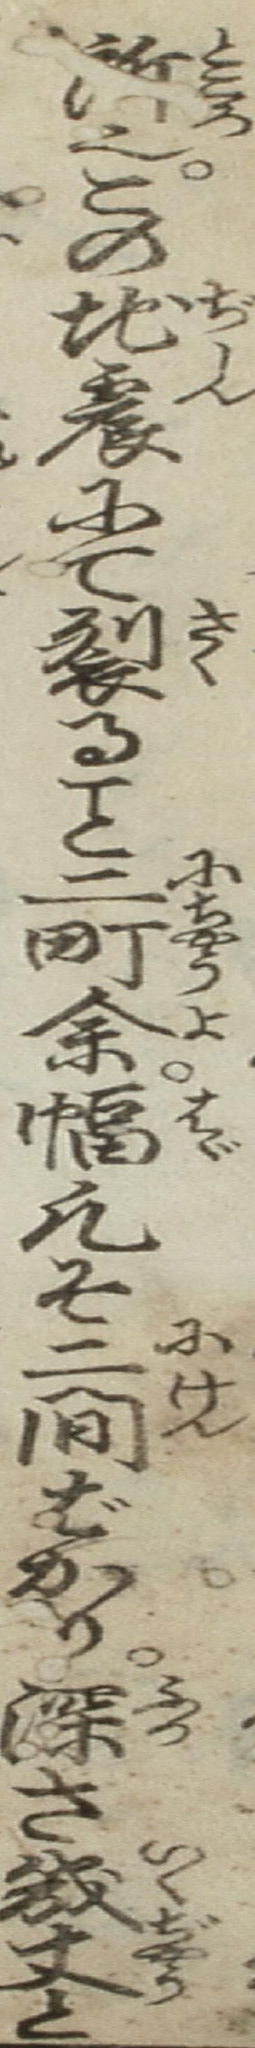所なり。この地震にて裂ること二町余。幅凡そ二間ばかり。深さ幾丈と
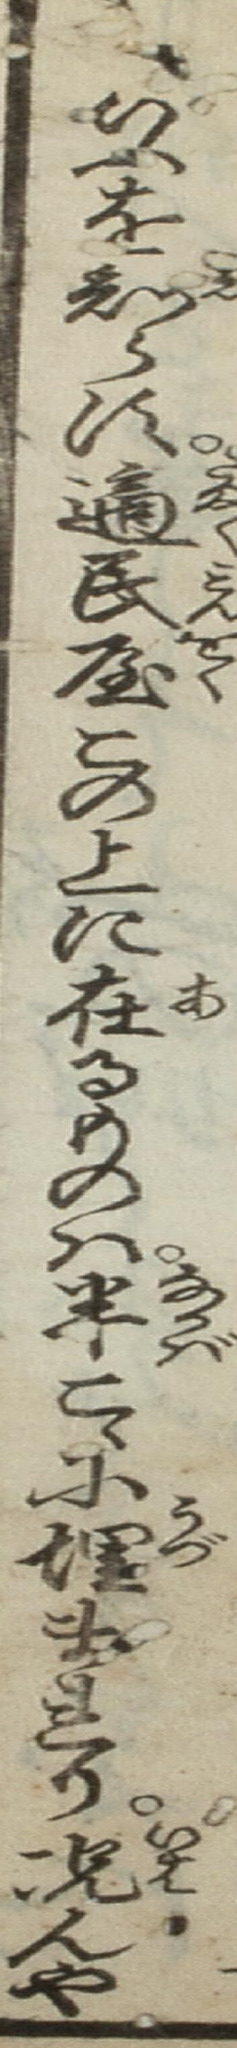いふを知らす。適民屋この上に在るものは。半こゝに埋まれり。況んや
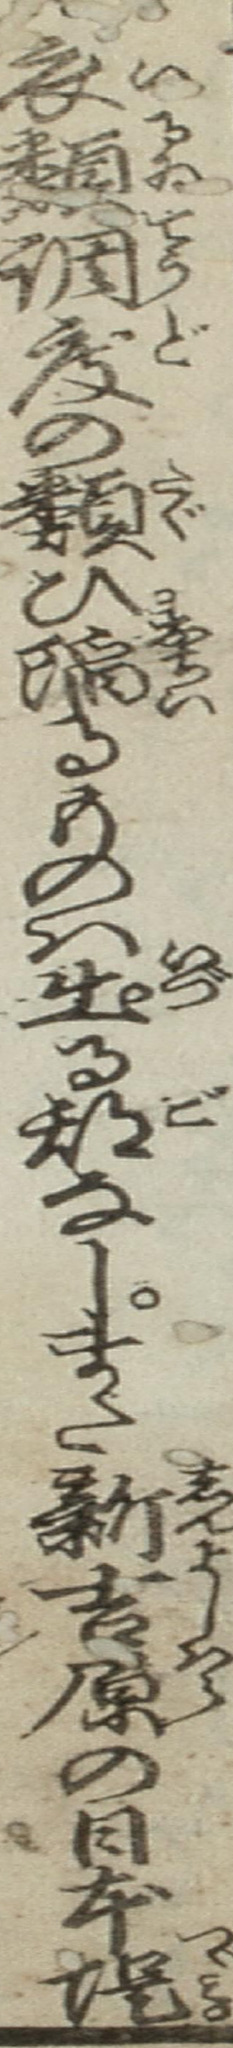衣類調度の類ひ陥るものは出る期なし。また新吉原の日本堤
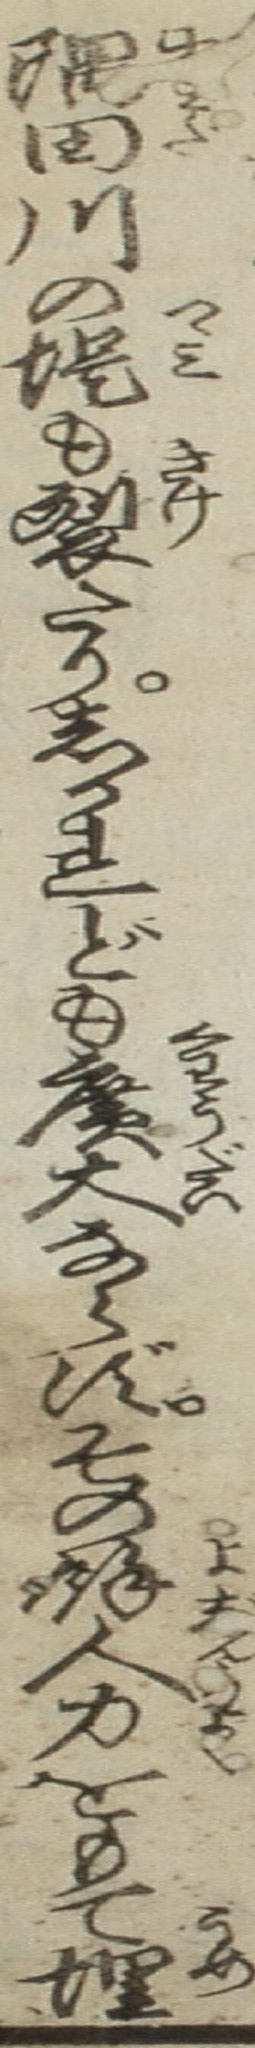隅田川の堤も裂たり。しかれども広大ならず。その餘人力をもて埋
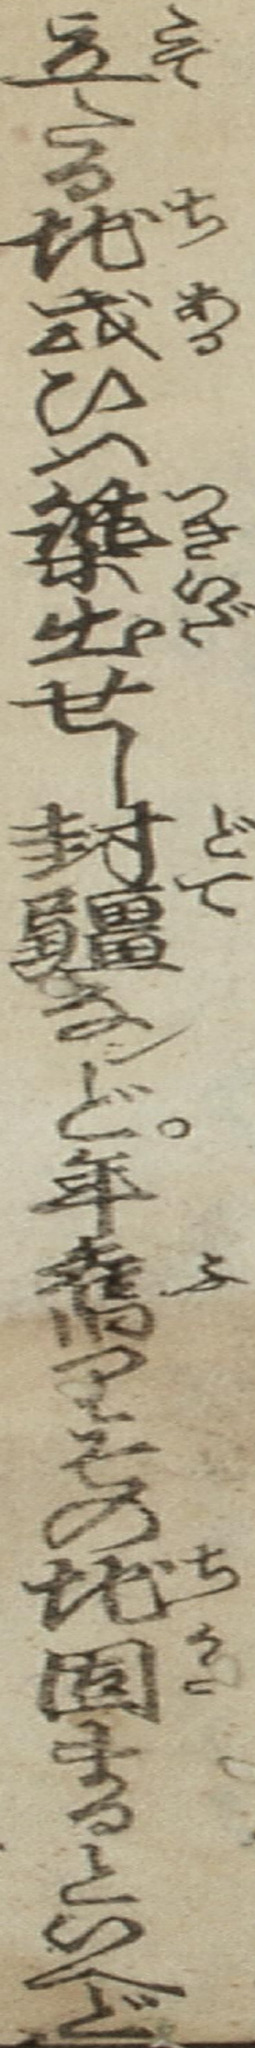立たる地或ひは築出せし封彊など。年舊りその地固まるといへど
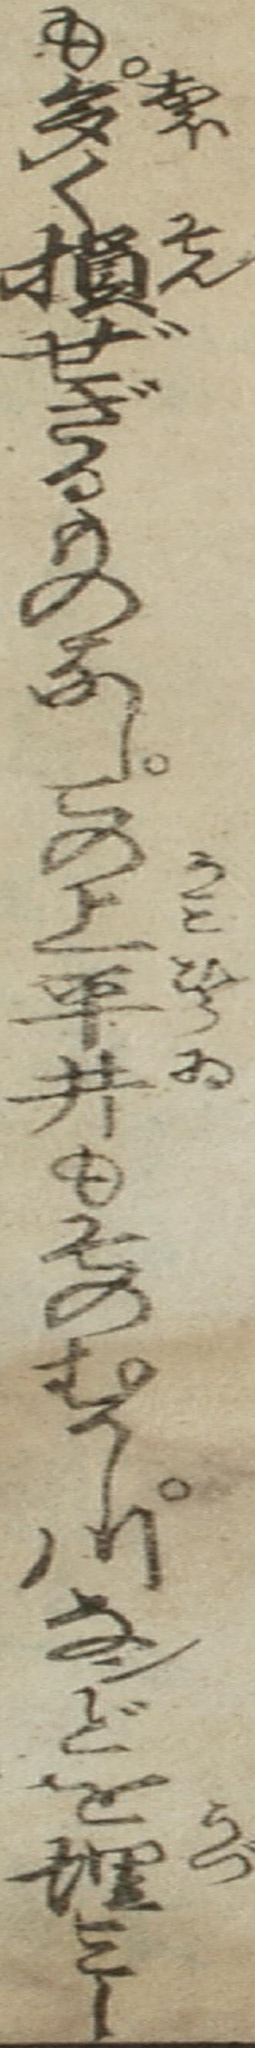も。多く損ぜざるものなし。この上平井もそのむかし。川などを埋みし
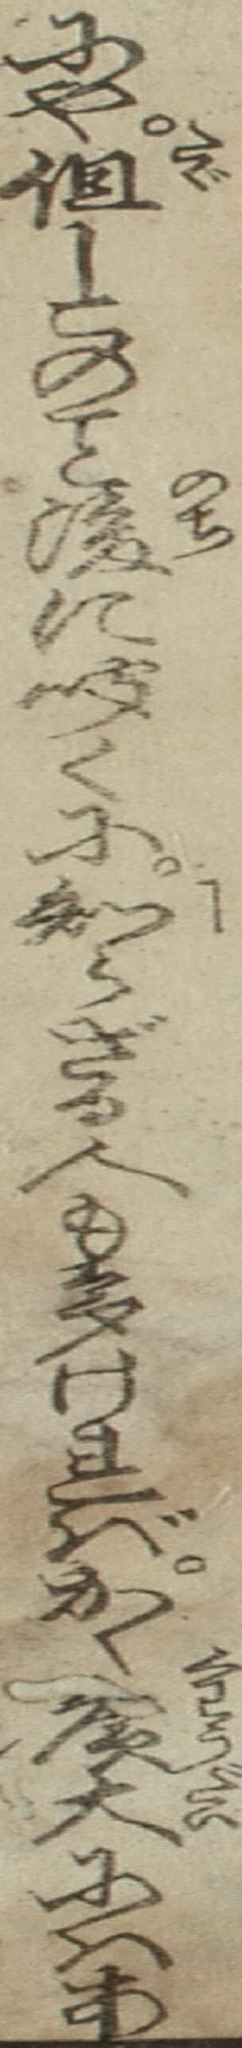にや。但しこのこと後に聞くに。知らざる人も多ければ。かく広大にはあ
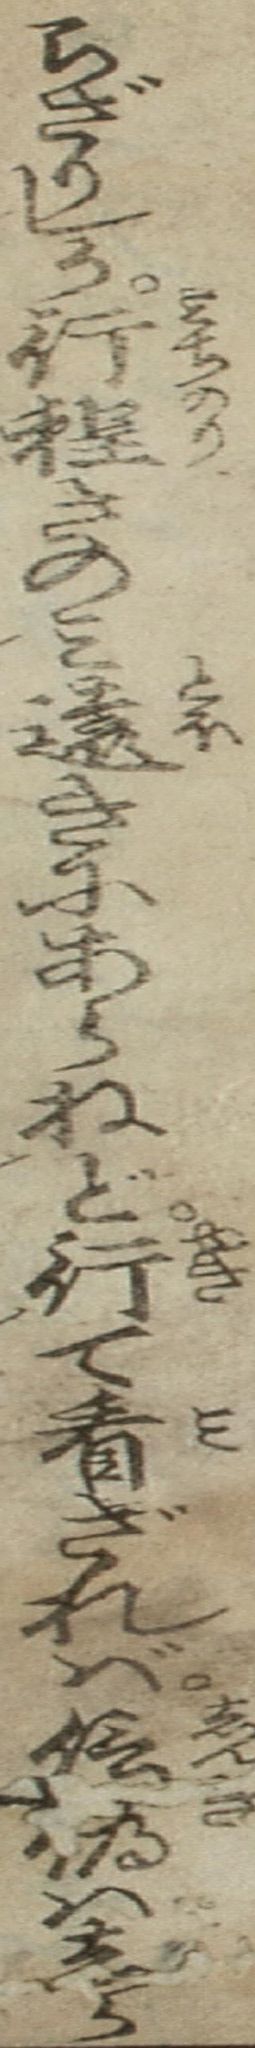らざりしか。行程さのみ遠きにあらねど。行て看ざれば。信偽はしら
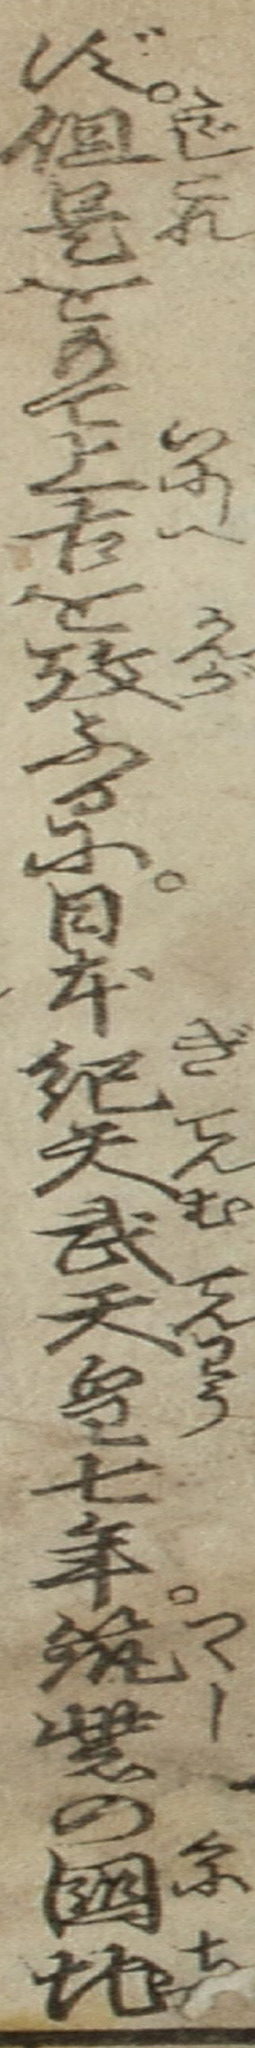ず。但是をもて上古を攷ふるに。日本紀天武天皇七年。筑紫の国地
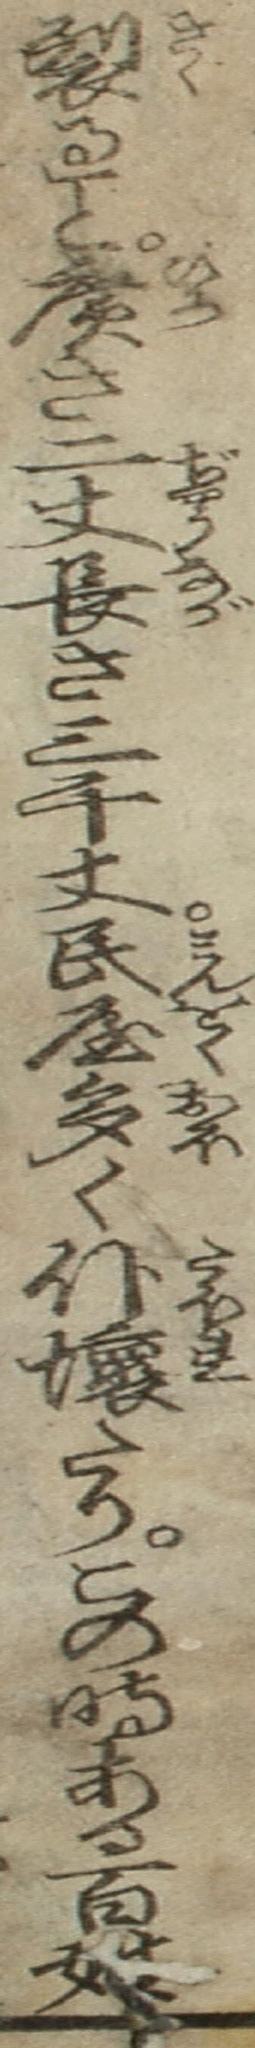裂ること。広さ二丈長さ三千丈。民屋多く仆壊たり。この時ある百姓
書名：安政見聞録　中
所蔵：東京大学地震研究所図書室 Earthquake Research Institute Library, The University of Tokyo, JAPAN
